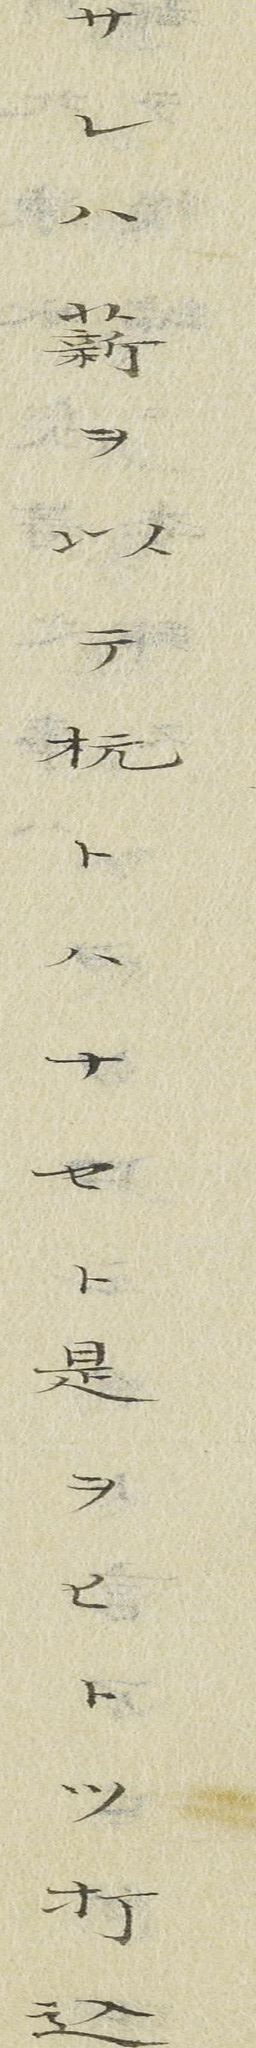サレハ薪ヲ以テ杭トハナセト是ヲヒトツ打込
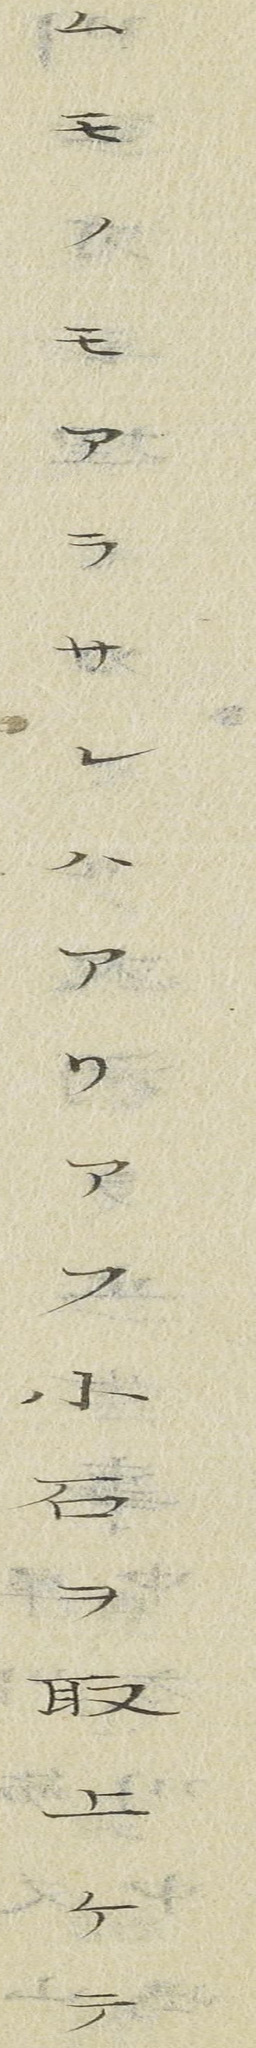ムモノモアラサレハアリアフ小石ヲ取上ケテ
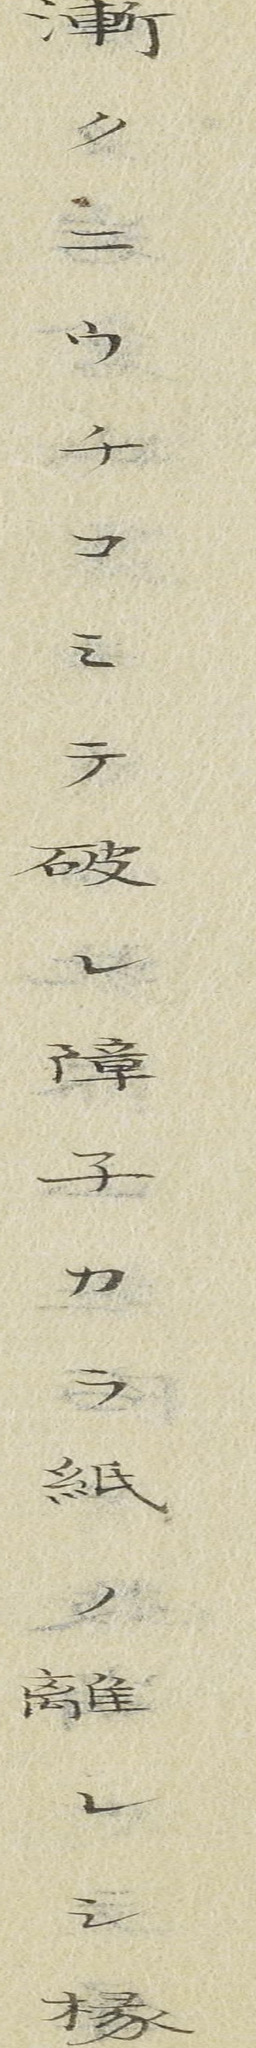漸クニウチコミテ破レ障子カラ紙ノ離レシ椽
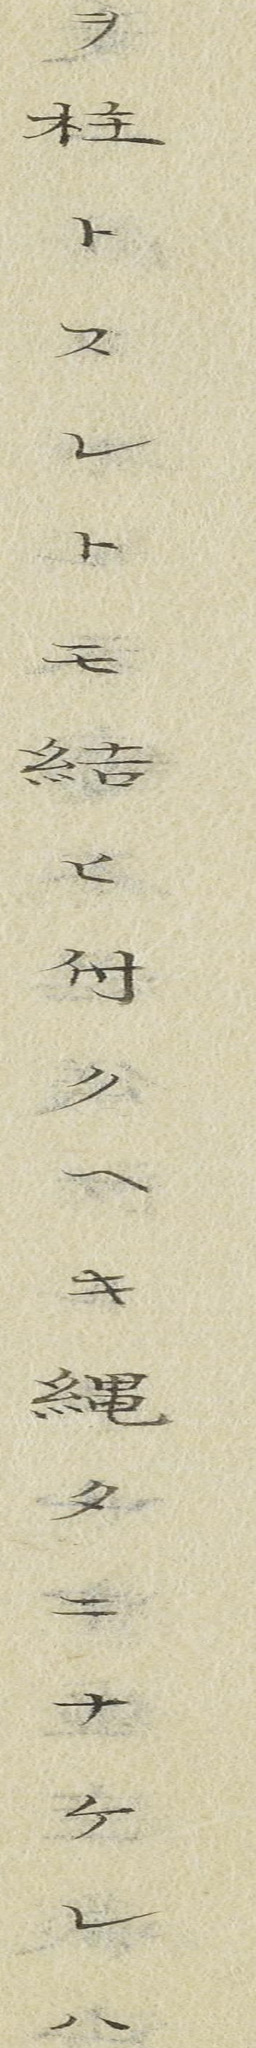ヲ柱トスレトモ結ヒ付クヘキ縄タニナケレハ
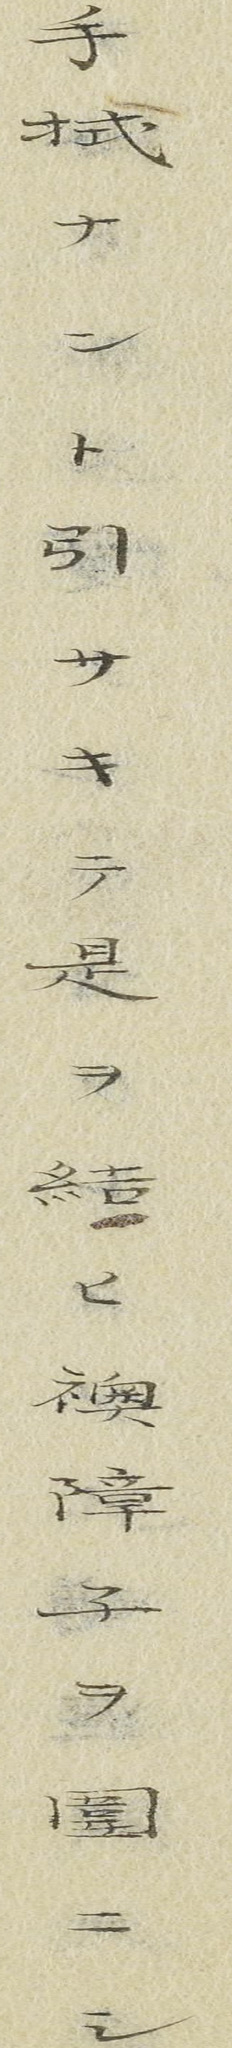手拭ナント引サキテ是ヲ結ヒ襖障子ヲ囲ニシ
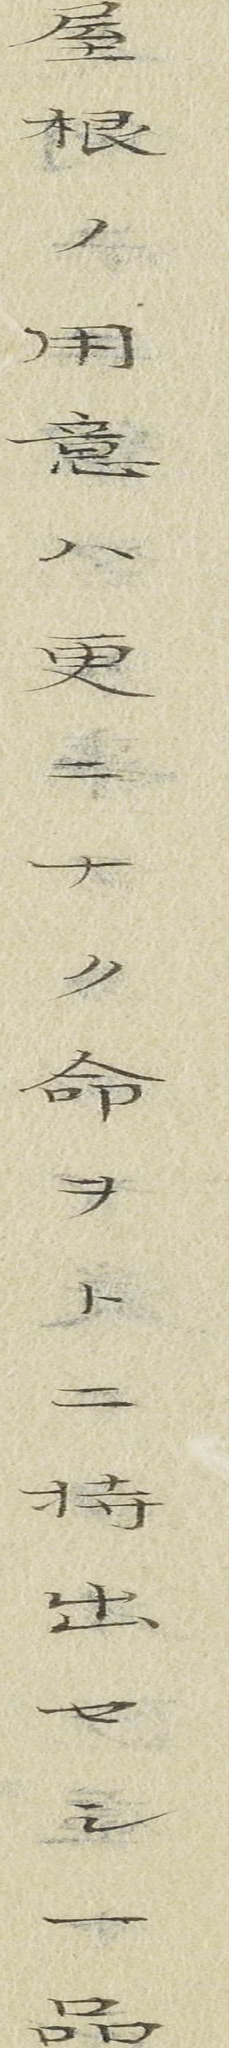屋根ノ用意ハ更ニナク命ヲトニ持出セシ一品
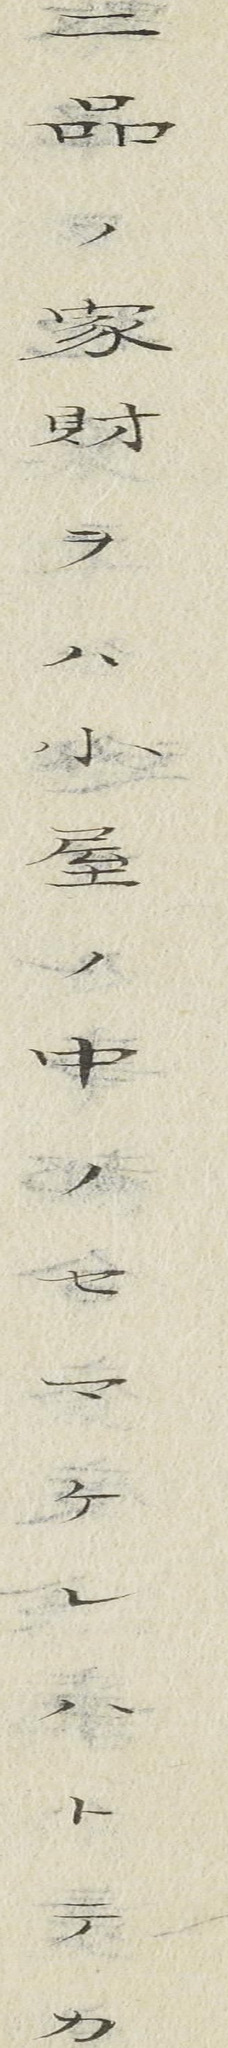二品ノ家財ヲハ小屋ノ中ノセマケレハトテカ
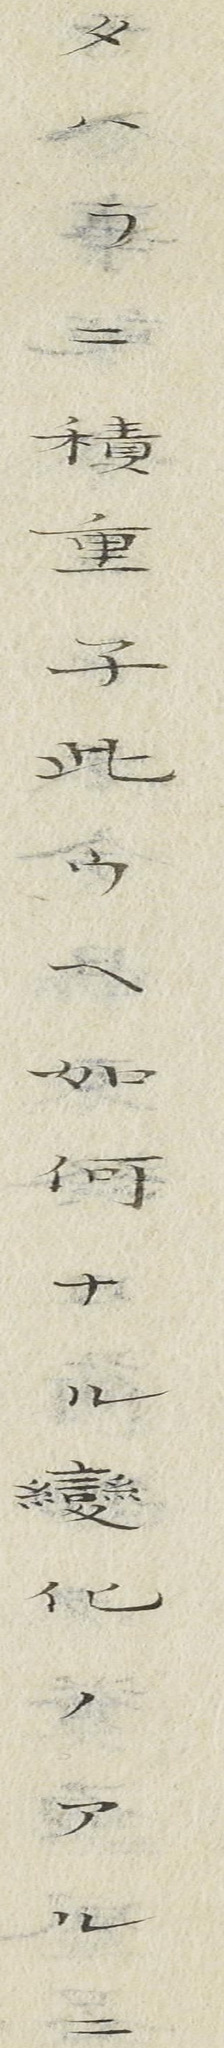タハラニ積重子此ウヘ如何ナル変化ノアルニ
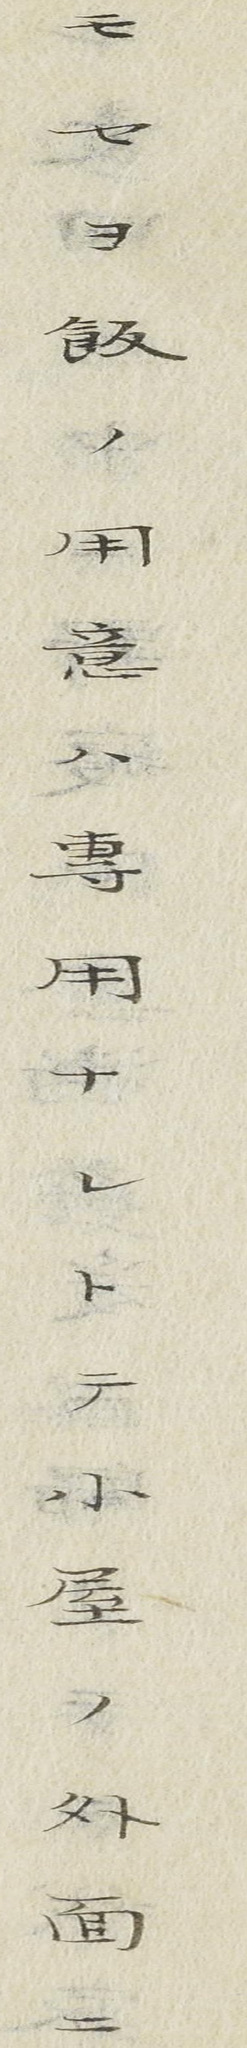モセヨ飯ノ用意ハ専用ナレトテ小屋ノ外面ニ
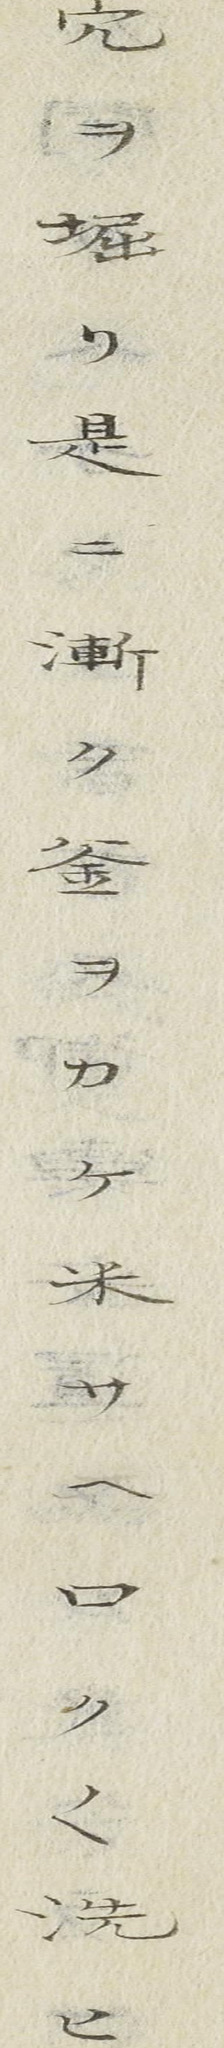穴ヲ堀リ是ニ漸ク釜ヲカケ米サヘロク〱洗ヒ
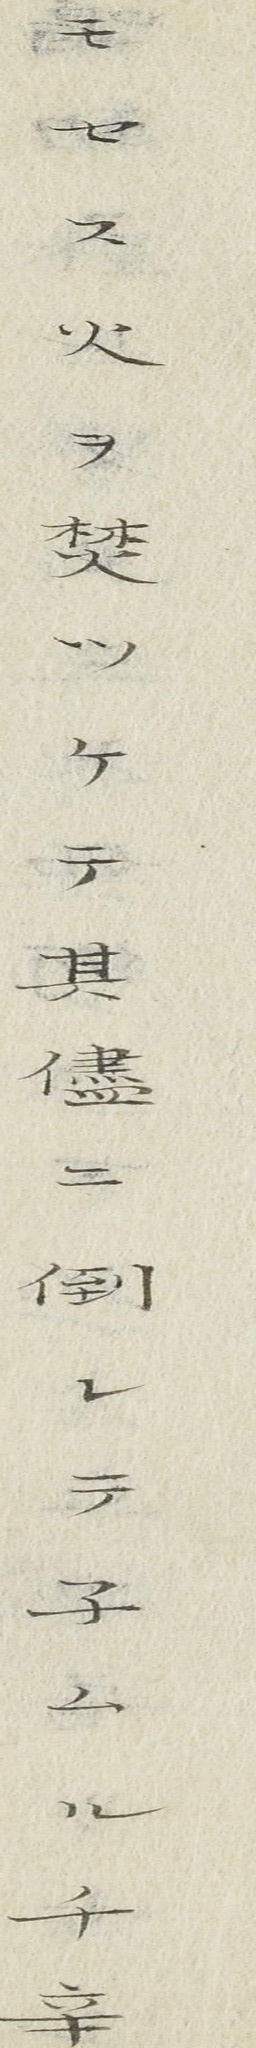モセス火ヲ焚ツケテ其侭ニ倒レテ子ムル千辛
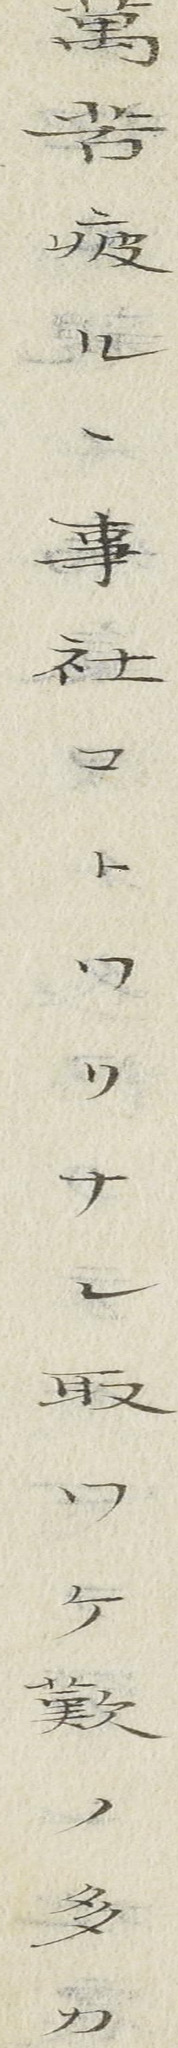万苦疲ルヽ事社コトワリナレ取ワケ歎ノ多カ
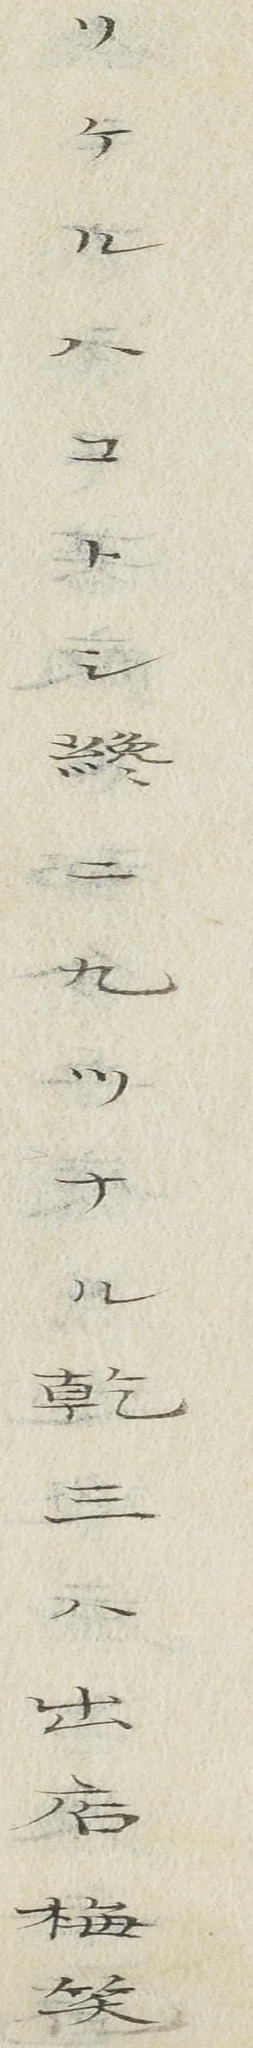リケルハコトシ終ニ九ツナル乾三ハ出店梅笑
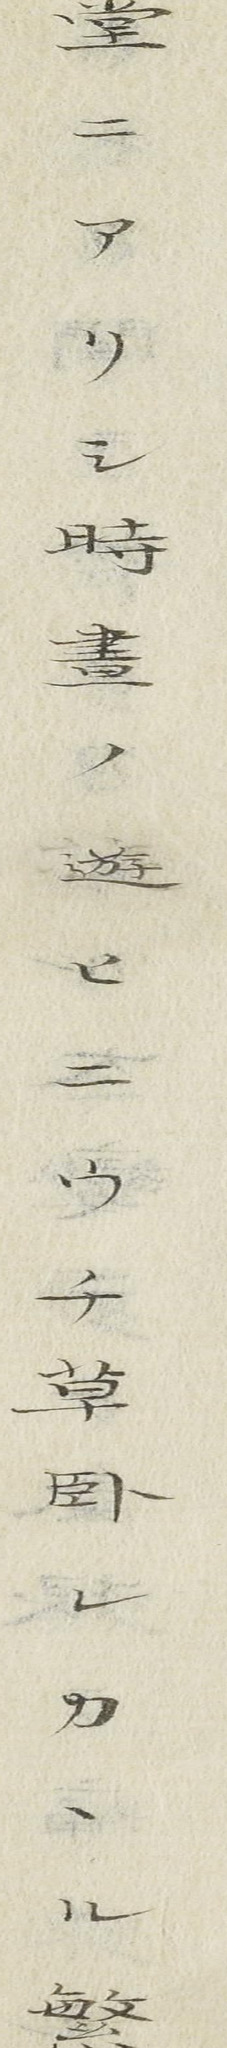堂ニアリシ時昼ノ遊ヒニウチ草臥レカヽル繁
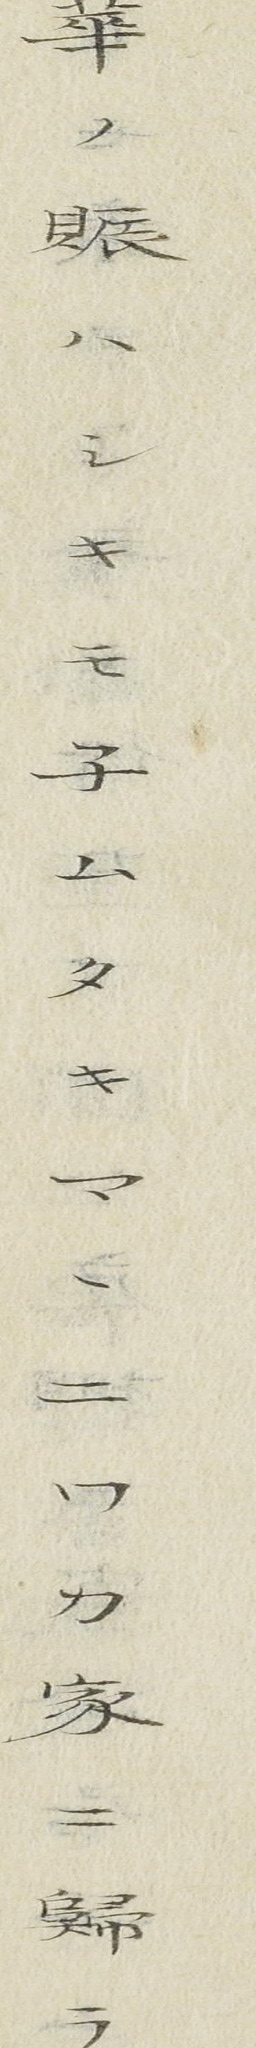華ノ賑ハシキモ子ムタキマヽニワカ家ニ帰ラ
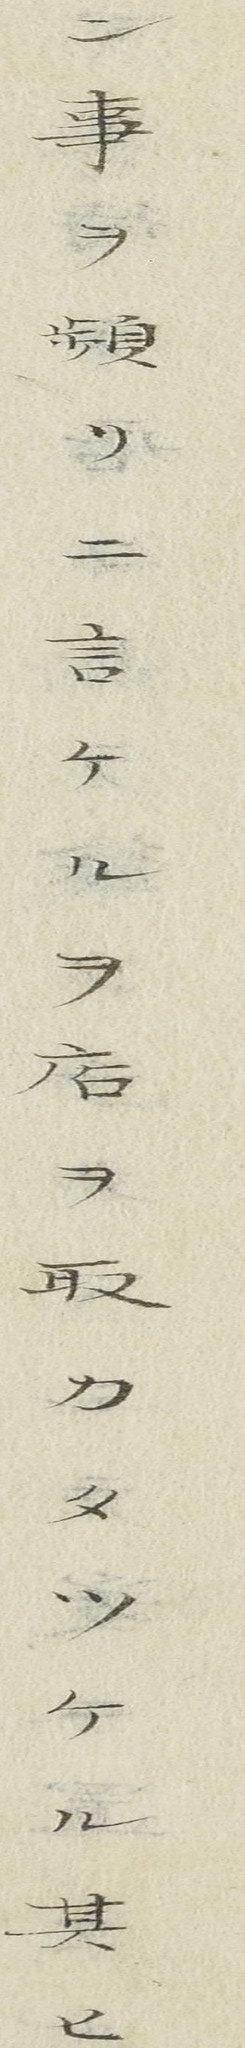ン事ヲ頻リニ言ケルヲ店ヲ取カタツケル其ヒ
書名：地災撮要　地震之部　巻ノ二
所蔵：東京大学地震研究所図書室 Earthquake Research Institute Library, The University of Tokyo, JAPAN
